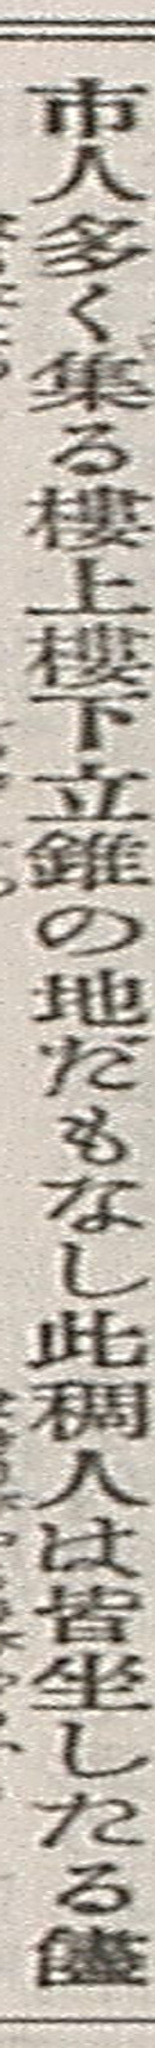市人多く集る楼上楼下立錐の地だになし此稠人皆坐したる儘
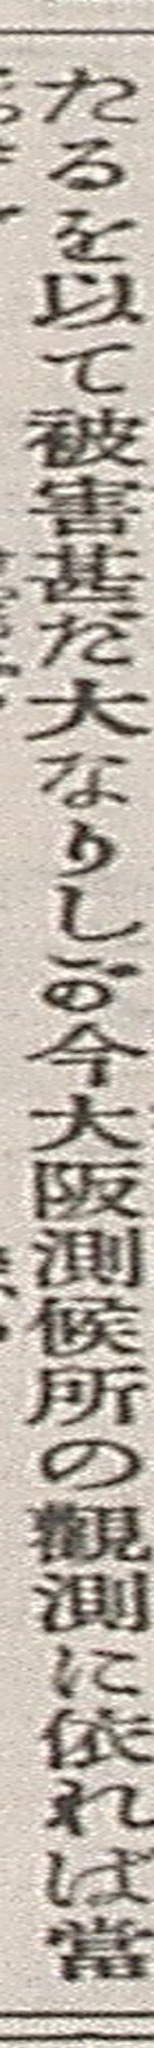たるを以て被害甚だ大なりしが今大坂測候所の観測に依れば当
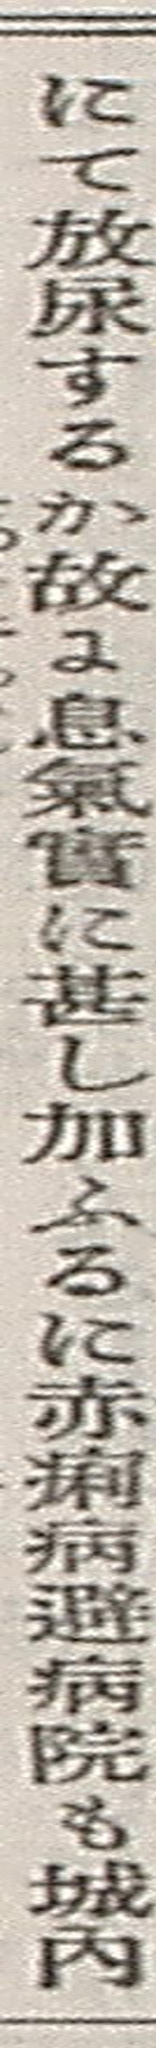にて放尿するか故に臭気実に甚し加ふるに赤痢病避病院も城内
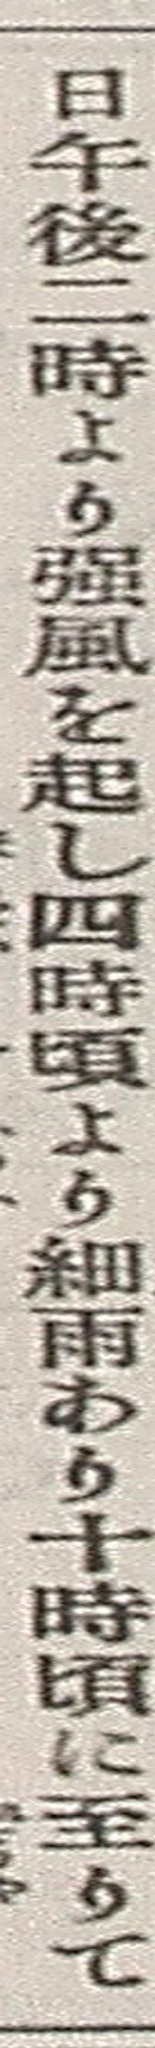日午後二時より強風を起し四時頃より細雨あり十時頃に至りて
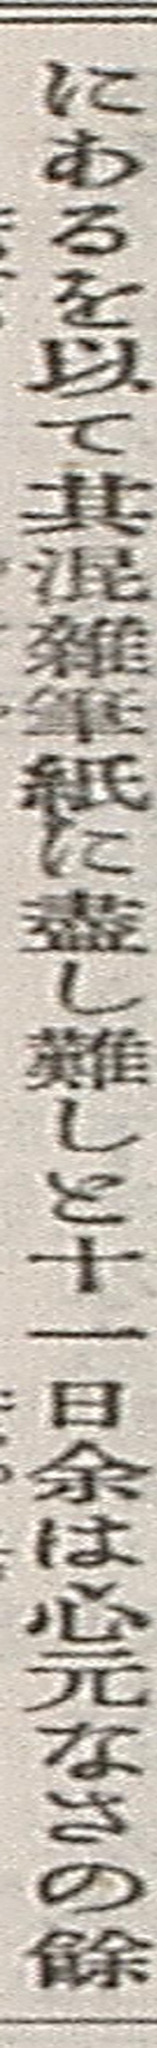にあるを以て其混雑筆紙に盡し難しと十一日余は心元なさの餘
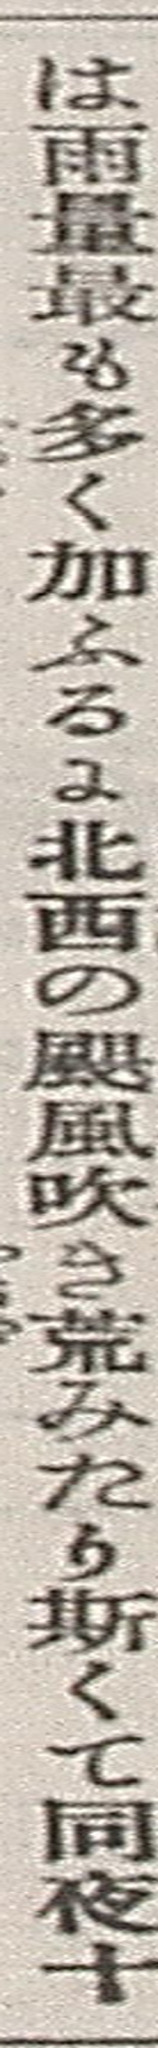は雨量最も多く加ふるに北西の颶風吹き荒みたり斯くて同夜十
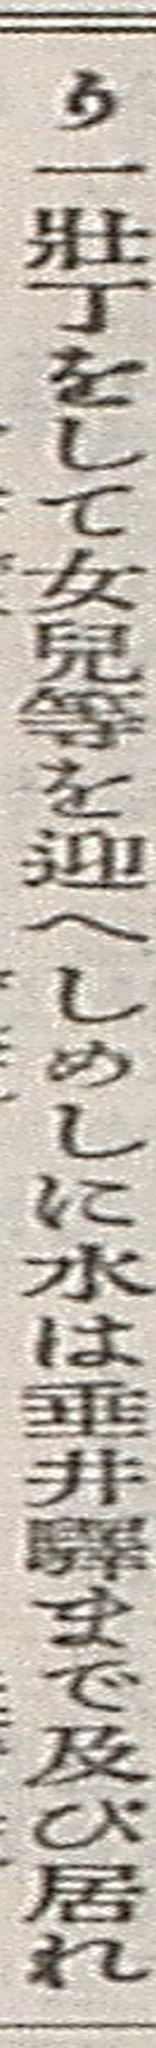り一壮丁をして女兒等を迎へしめしに水は垂井駅まで及び居れ
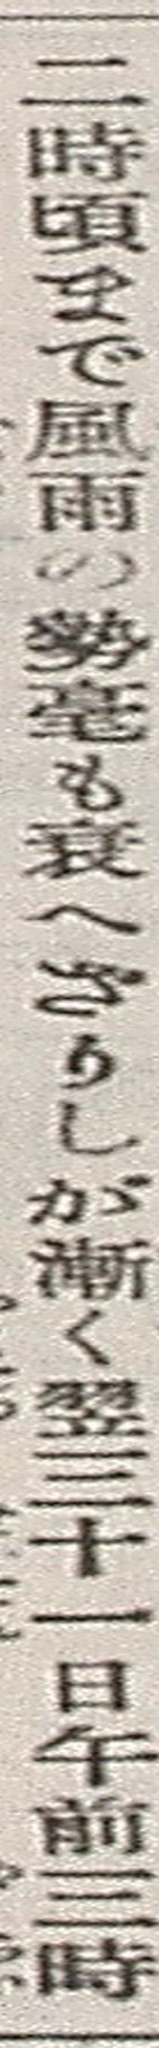二時頃まで風雨の勢毫も衰へざりしが漸く翌三十一日午前三時
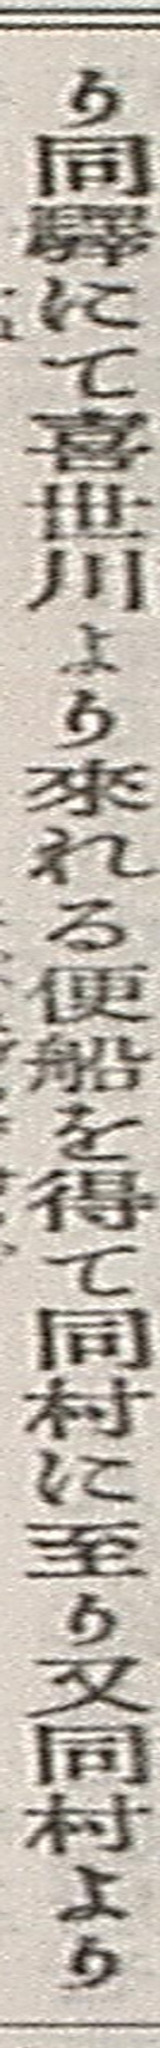り同駅にて喜世川より来れる便船を得て同村に至り又同村より
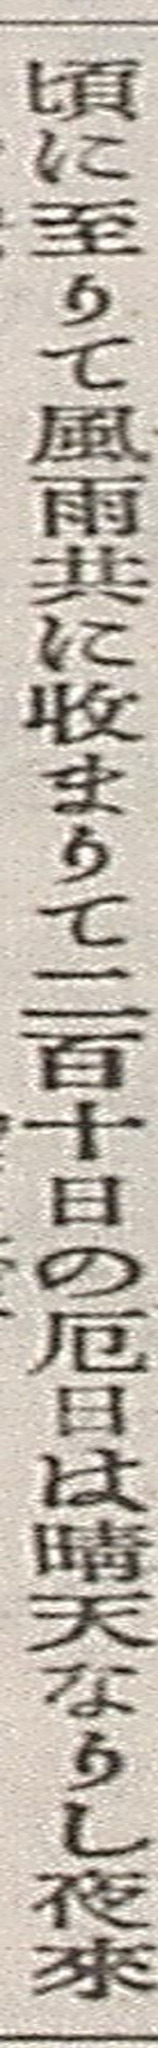頃に至りて風雨共に収まりて二百十日の厄日は晴天なりし夜来
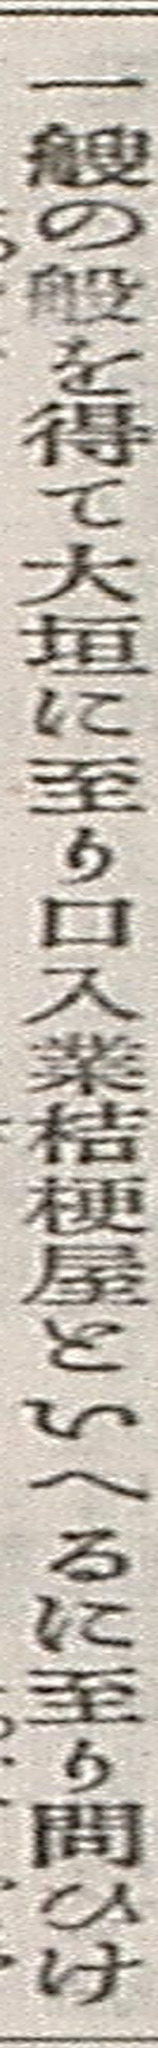一艘の船を得て大垣に至り口入業桔梗屋といへるに至り問ひか
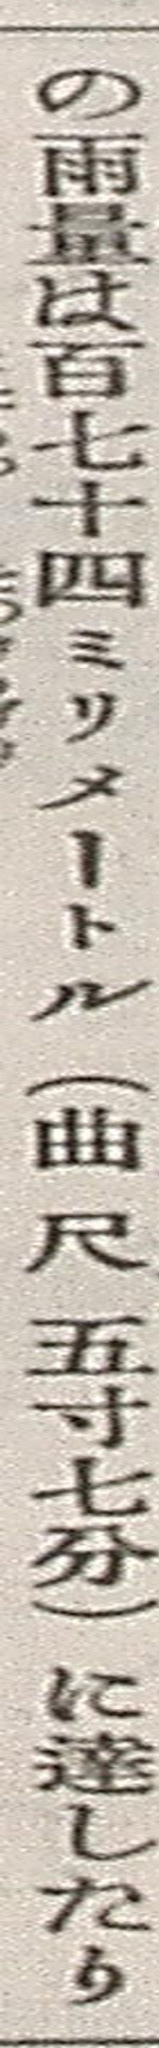の雨量は百七十四ミリメートル五寸七分）に達したり
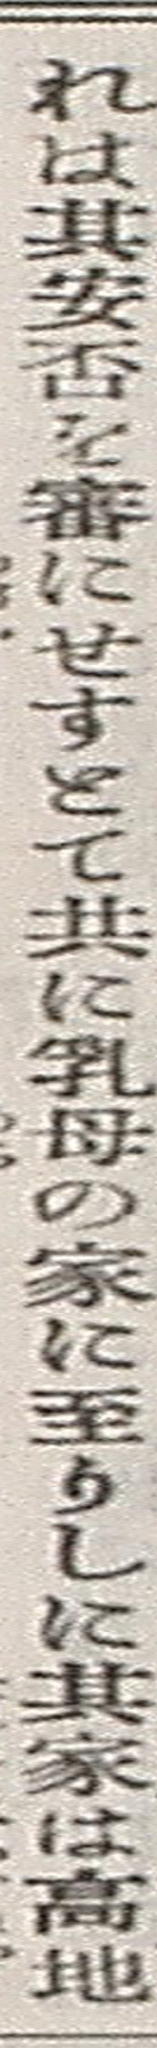れは其安否を審にせすとて共に乳母の家に至りしに其家は高地
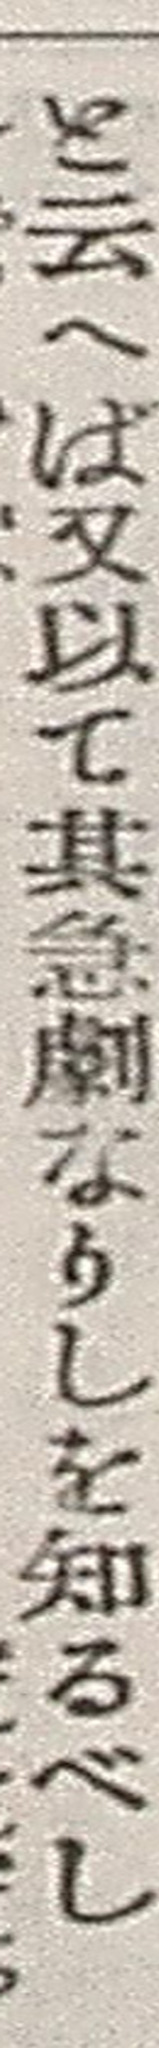と云へば又以て其急劇なりしを知るべし
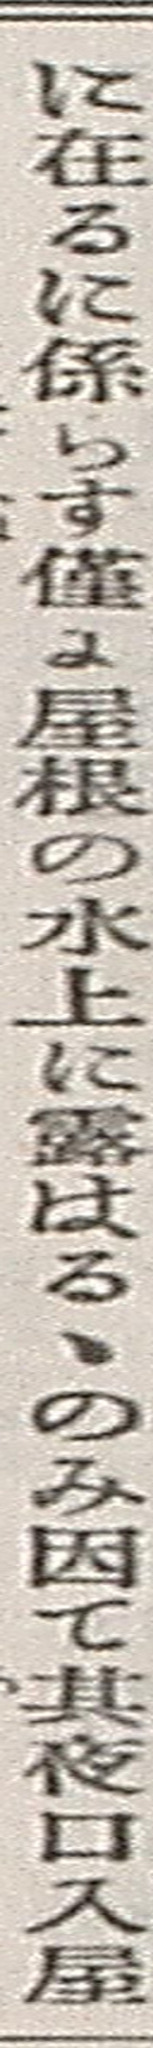に在るに係らす僅に屋根の水上に露はるゝのみ因て其夜口入屋
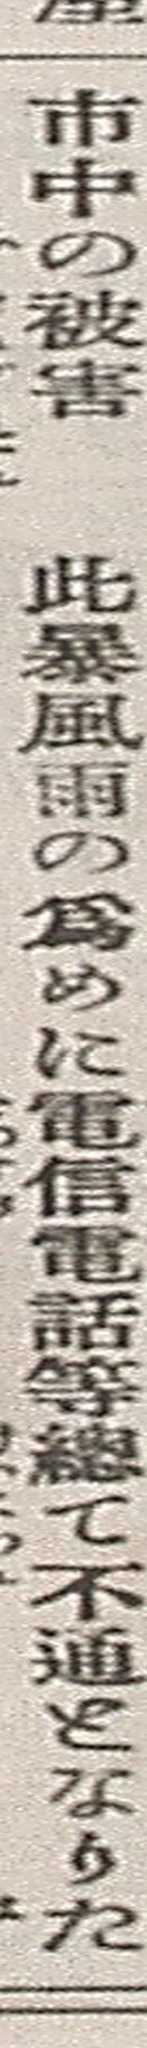市中の被害此暴風雨の為めに電信電話等総て不通となりた
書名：風俗畫報臨時増刊第百二十八號　洪水被害録（下）
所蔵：東京大学地震研究所図書室 Earthquake Research Institute Library, The University of Tokyo, JAPAN
